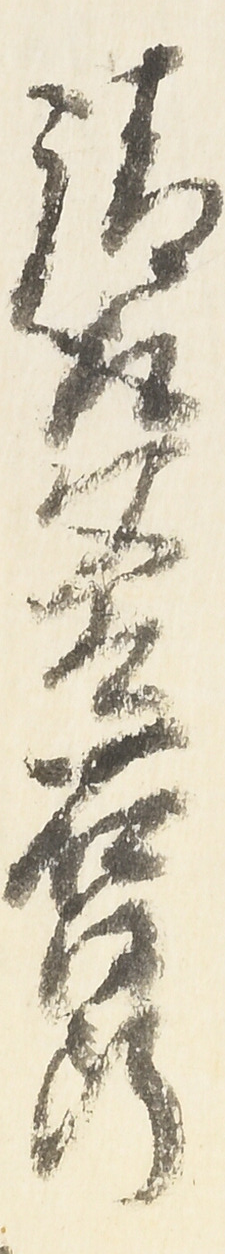請取文言右同断
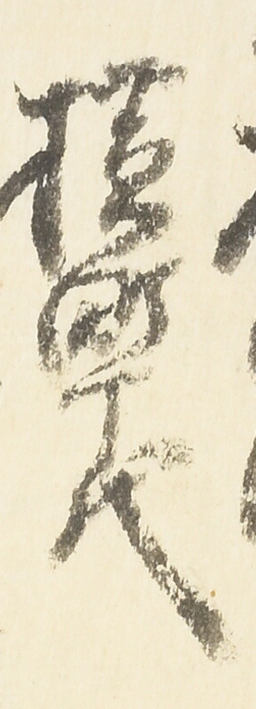横町丁代
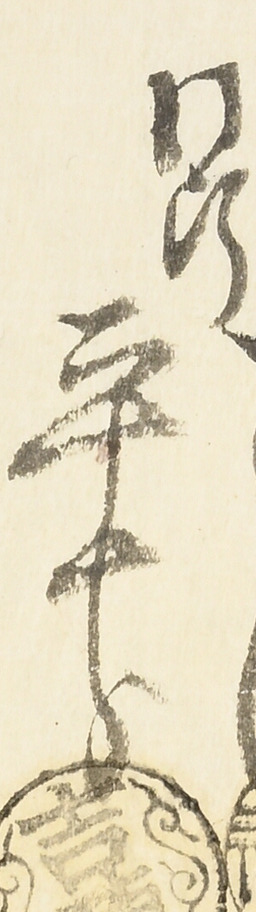平十郎
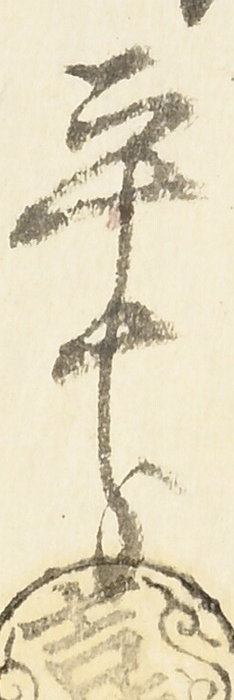平十郎
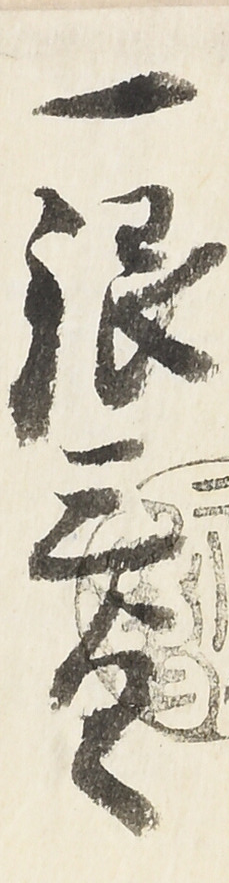一銀三匁
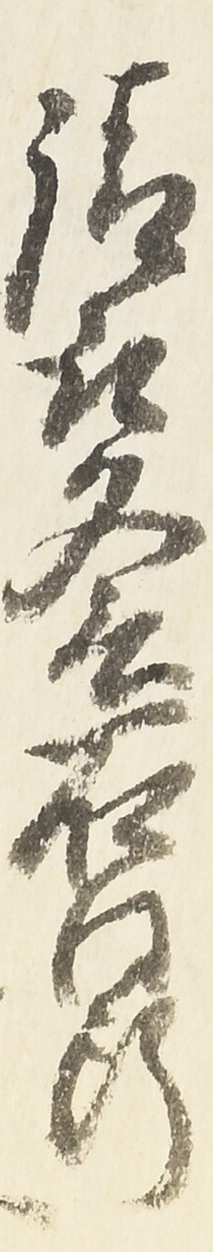請取文言右同断
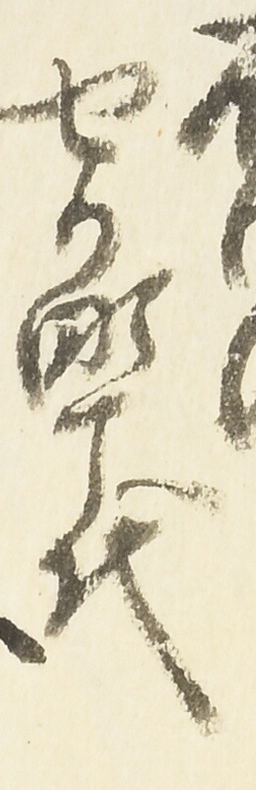せり町丁代
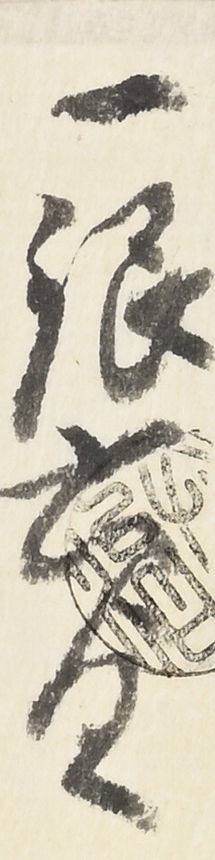一銀六匁
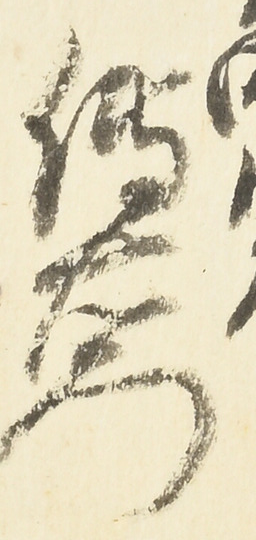伝右衛門
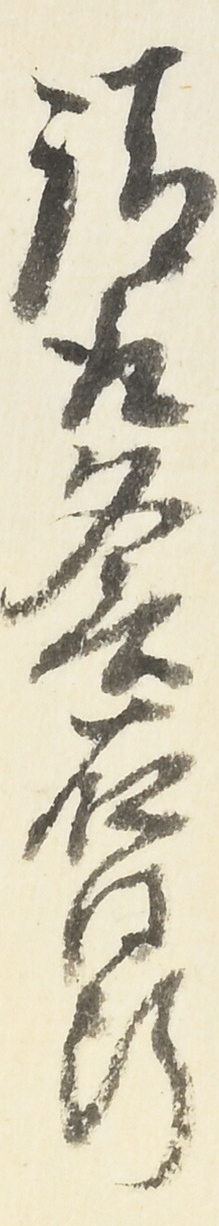請取文言右同断

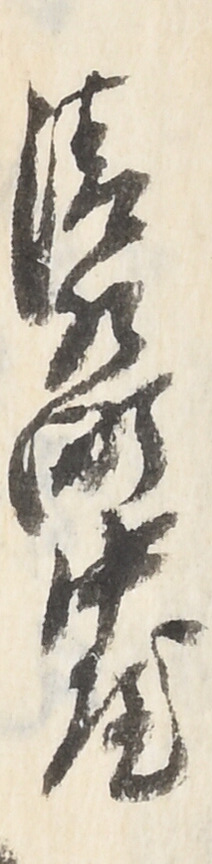清水町丁代
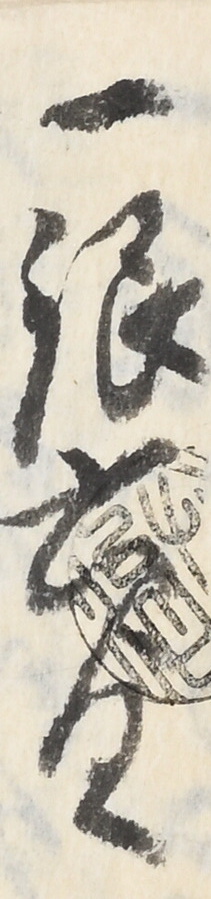一銀壱匁
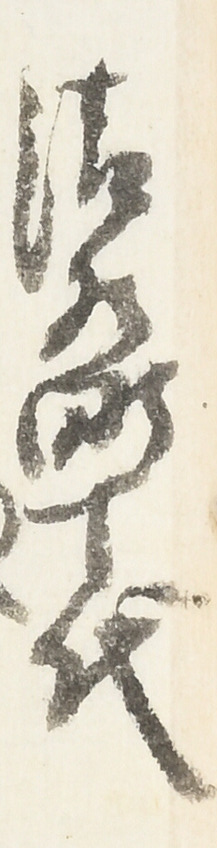清水町丁代
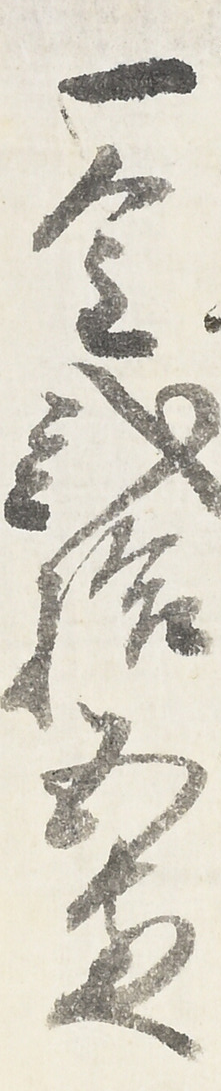一金弐拾五両
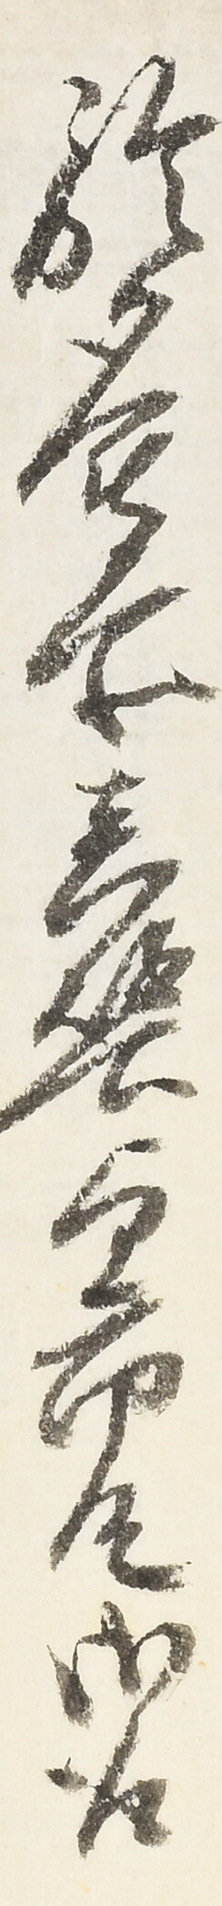於御会所真壁与市殿御取
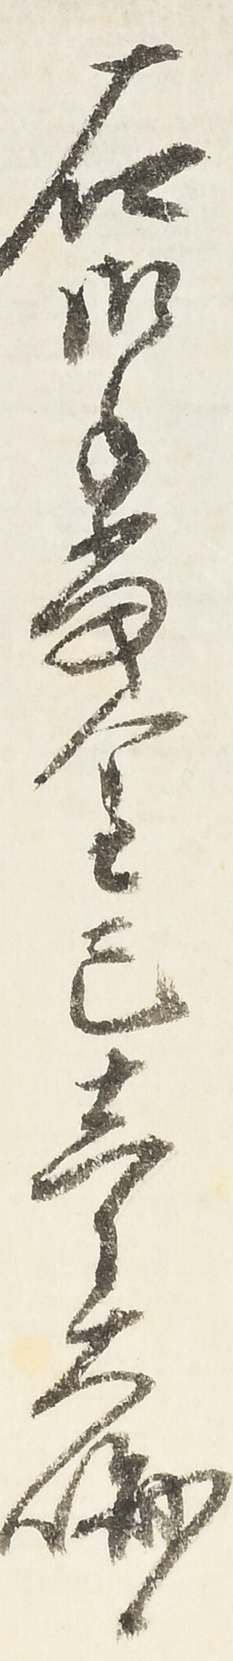右御手当金巳十二月大晦日
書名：御才覚金御利足割渡扣帳
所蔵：伊那市立高遠町図書館・合同会社AMANE
